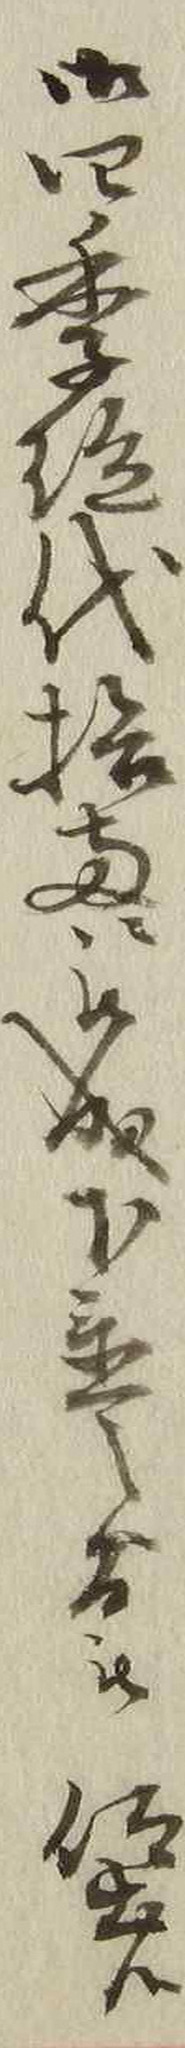御四季絶代拾両ニ被成下置之旨被仰出候
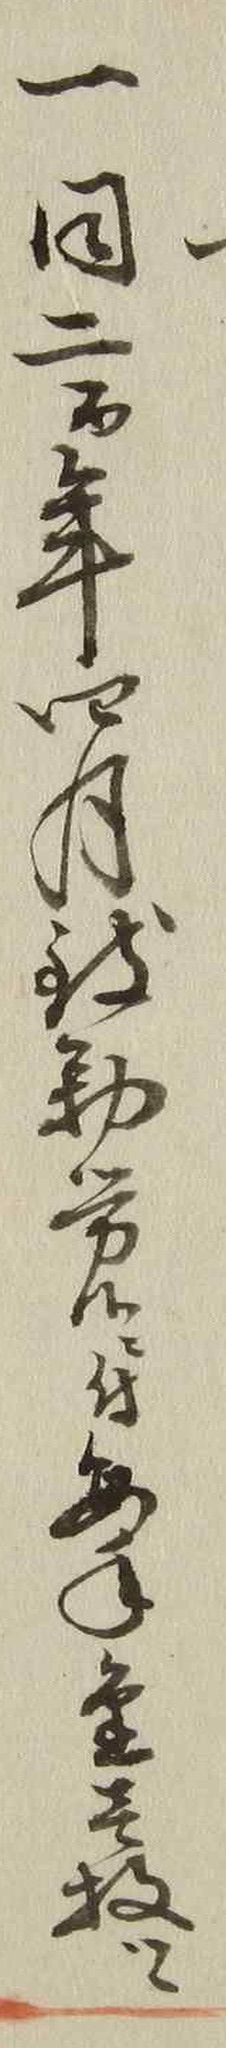一同二酉年四月致勤労候ニ付毎年金壱枚ツヽ
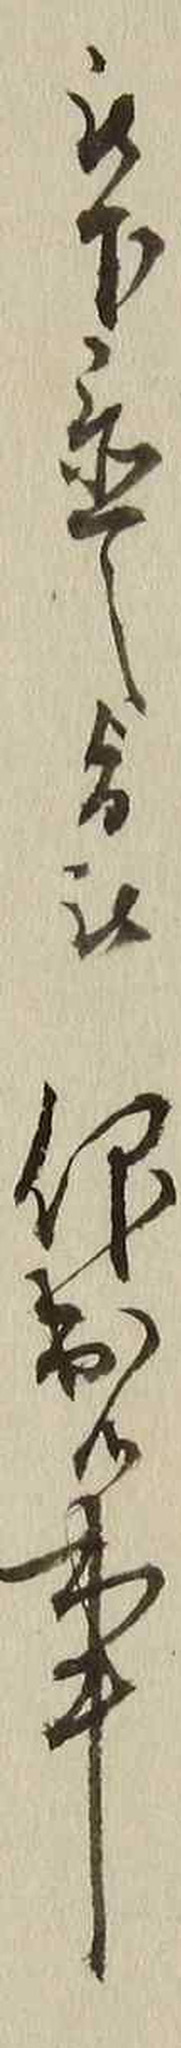被下置之旨被仰出候事
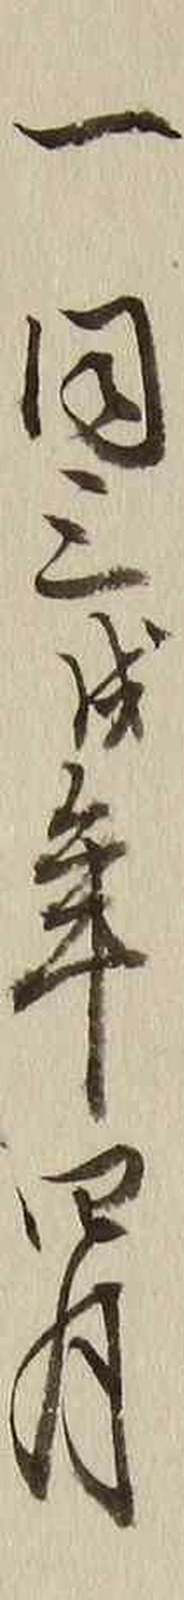一同三戊年四月
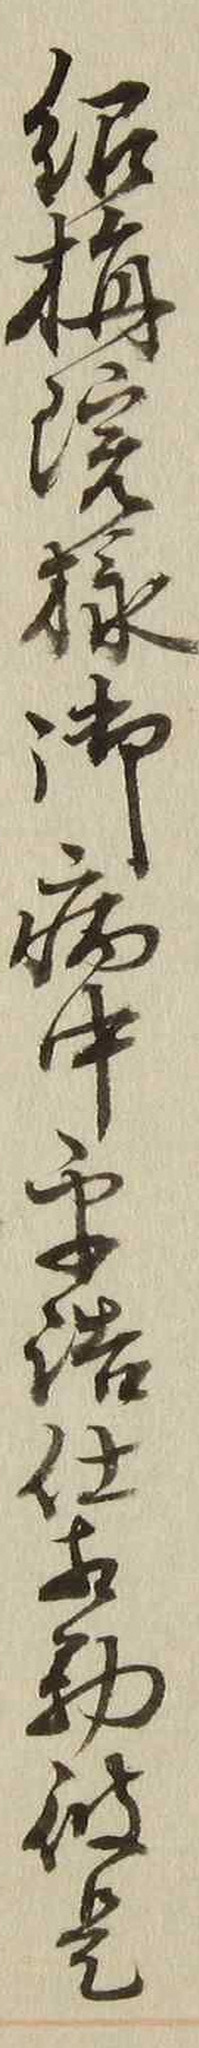紹栴院様御病中平詰仕相勤彼是
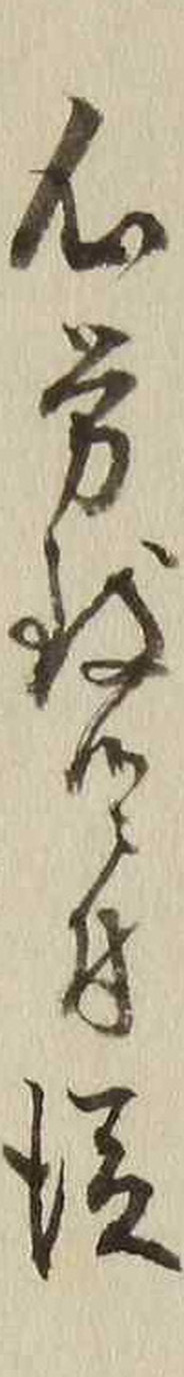心労致候ニ付従
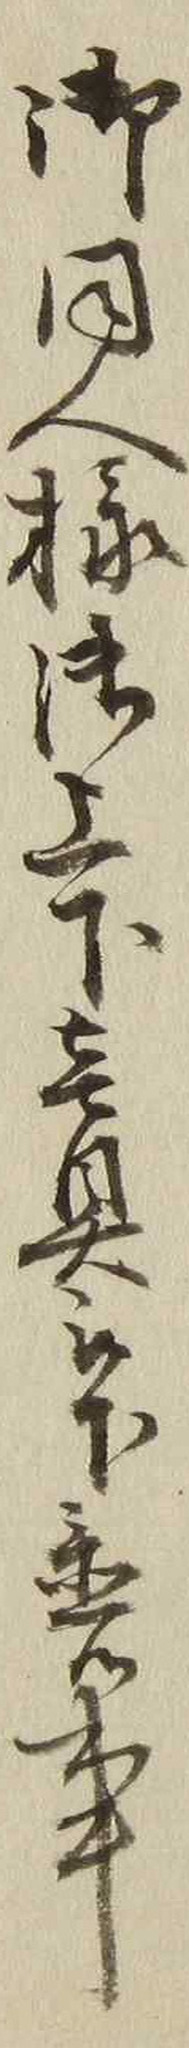御同人様御上下壱具被下置候事
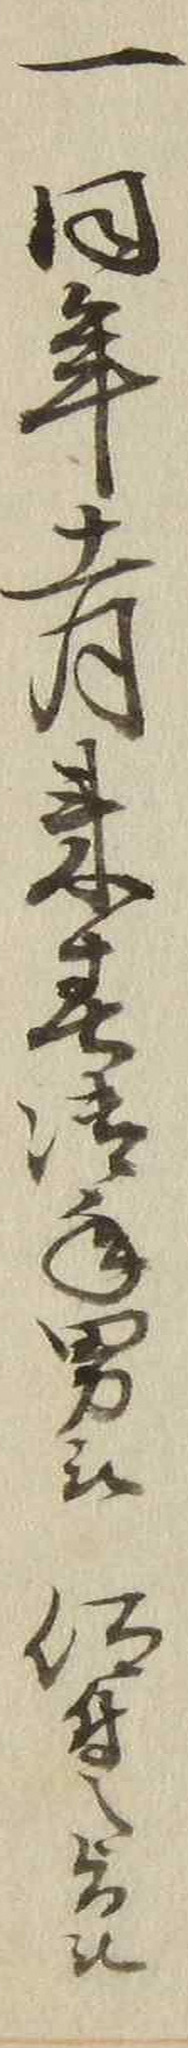一同年十一月来春御年男被仰付之旨被
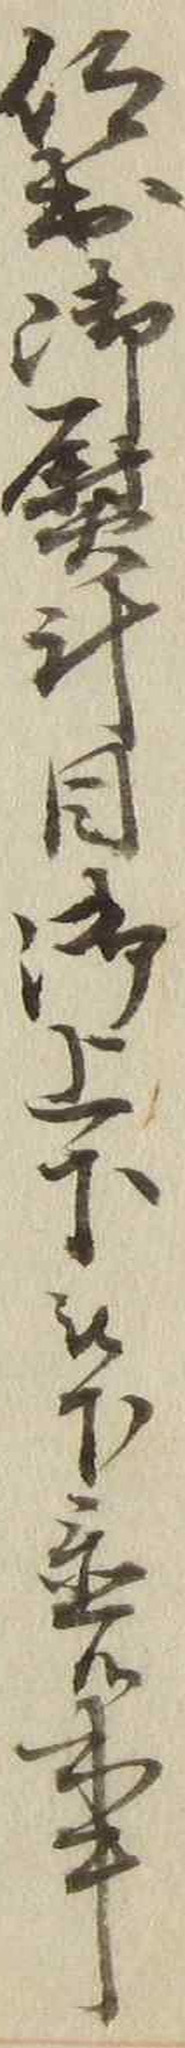仰出御熨斗目御上下被下置候事
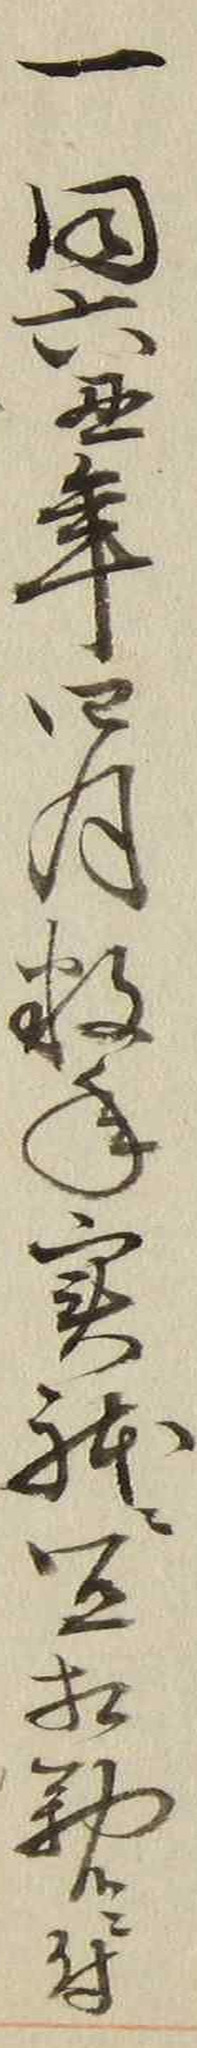一同六丑年四月数年実体ニ宜相勤候ニ付
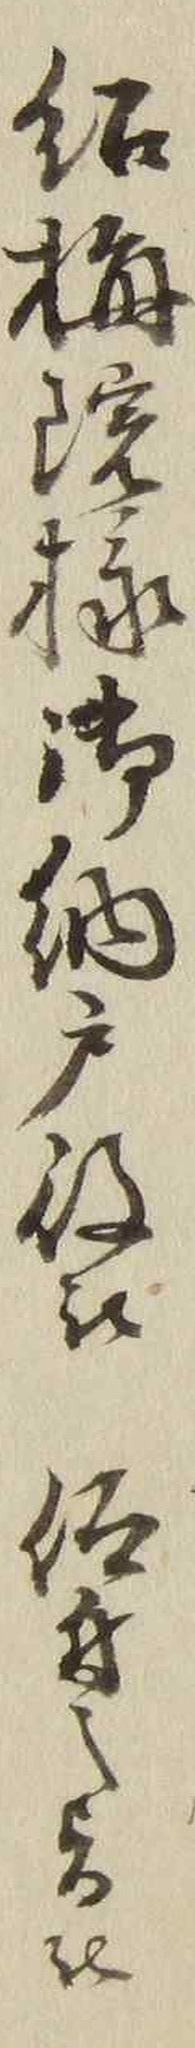紹栴院様御納戸役被仰付之旨被
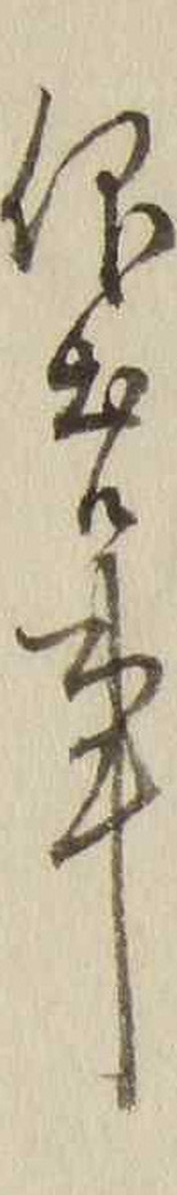仰出候事

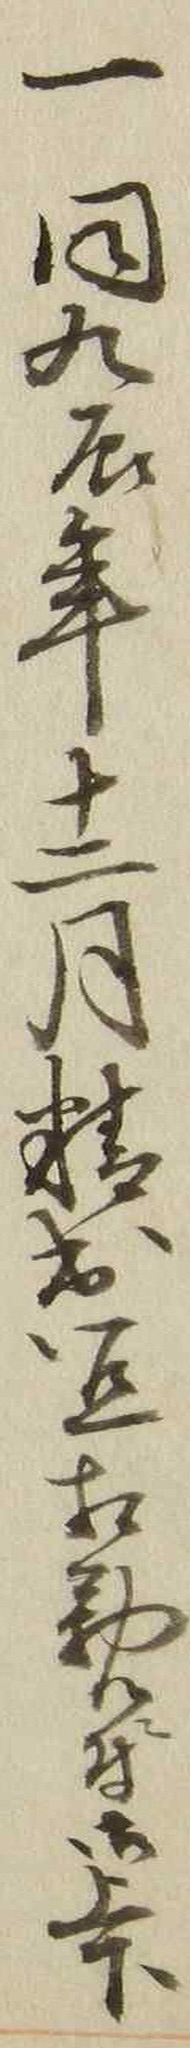一同九辰年十二月精出宜相勤候ニ付御上下
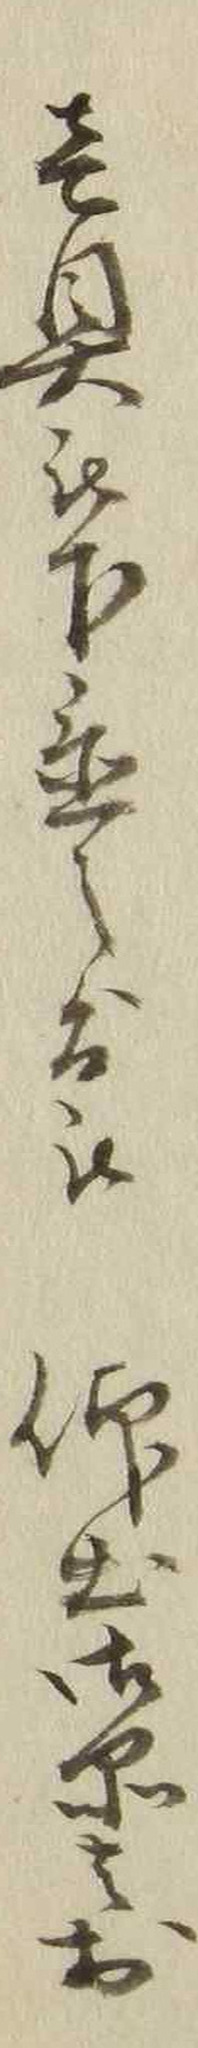壱具被下置之旨被仰出御品者於
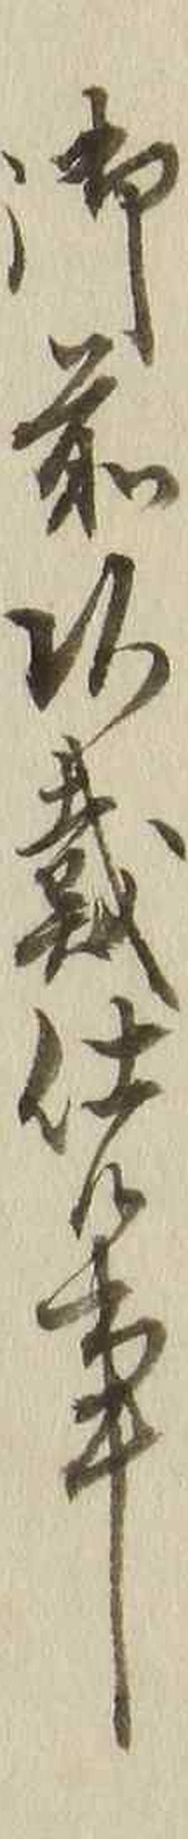御前頂戴仕候事
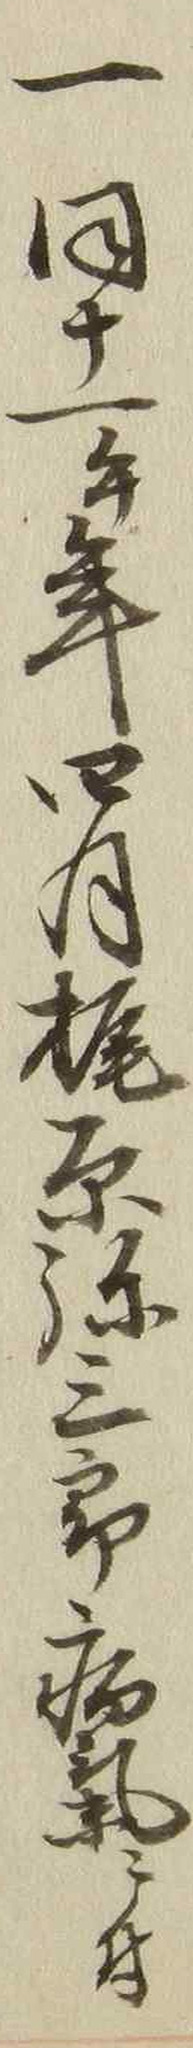一同十一午年四月梶原弥三郎病気ニ付
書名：諸士系譜　巻之23　い之部23
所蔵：会津若松市立会津図書館
